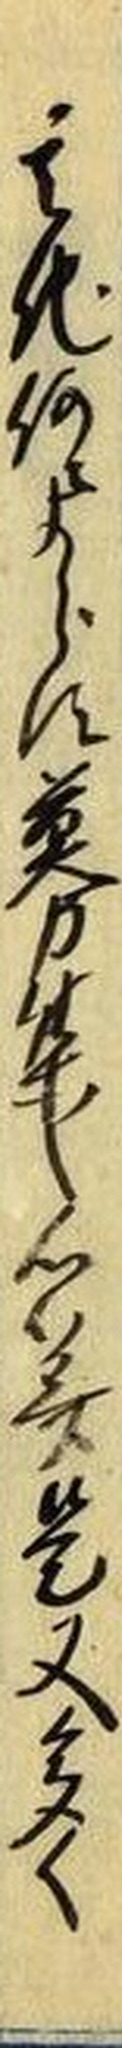其他何によらす募集し心算是又多く
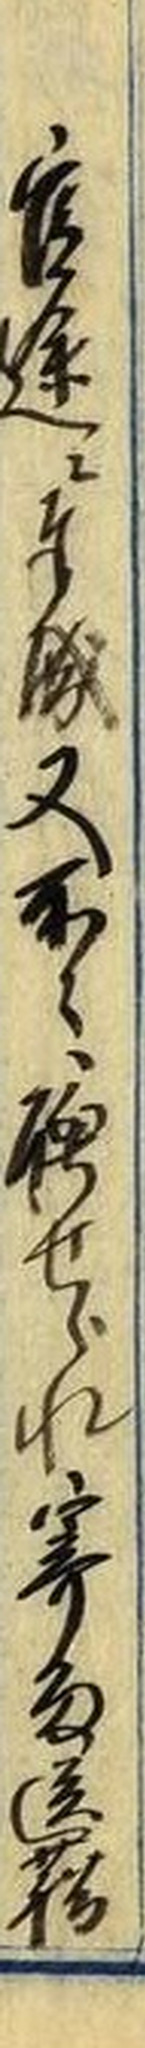官途に奉職又所々に聘せられ寄留送藉
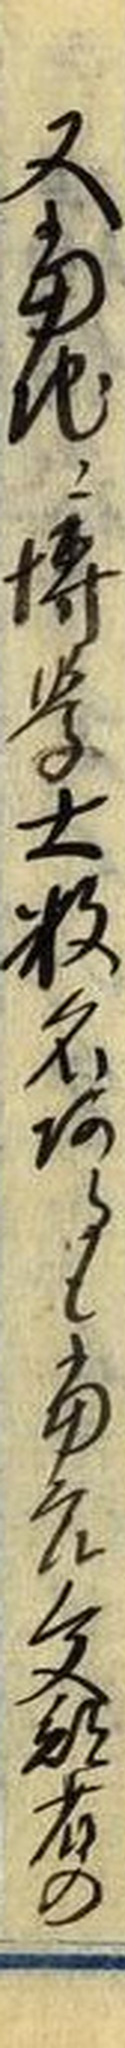又当地に博学士数名あるも当節文部省の
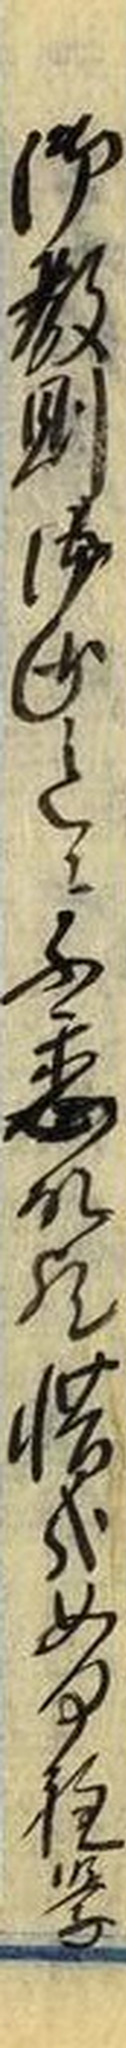御教則御趣意に不悉故歟惜哉如何程学
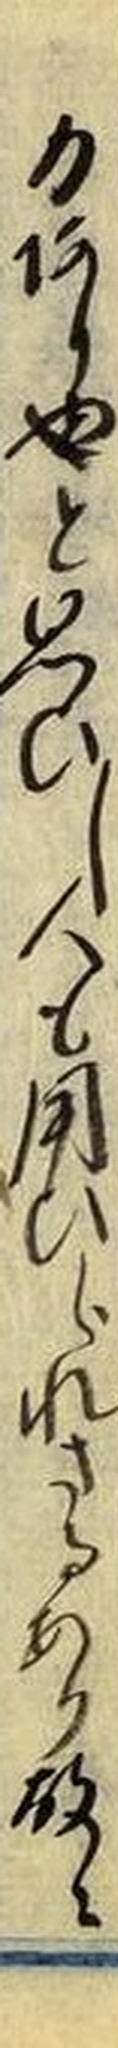力ありやと思ひし人も用いられさるあり故に
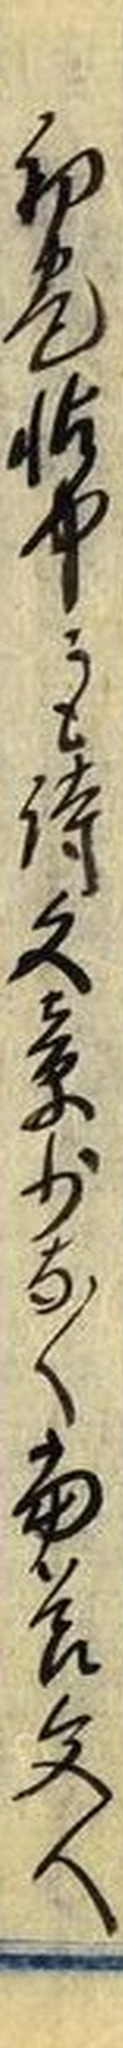初尽帖中にも詩文章少なく当節文人
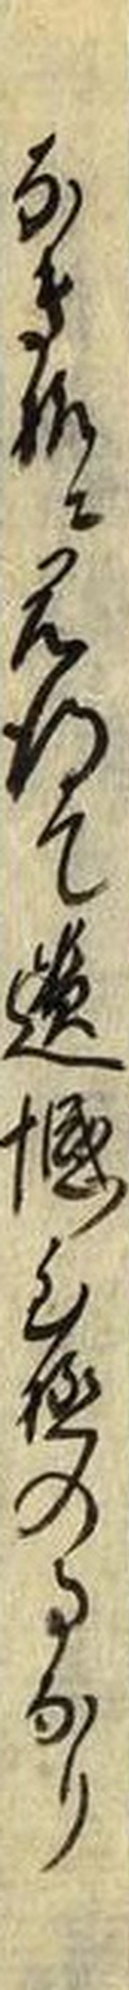なき様に見得て遺憾至極の事なり
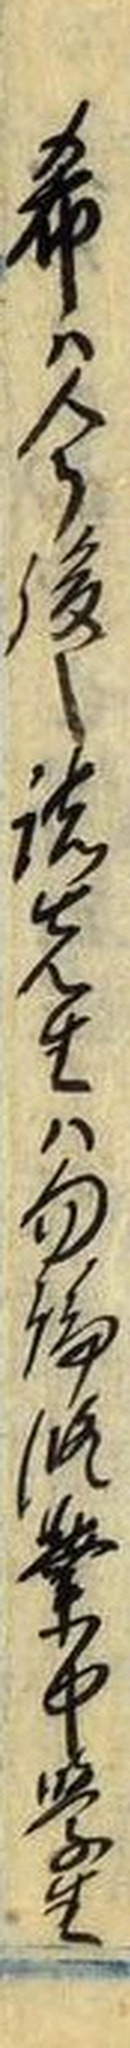希は今後之諸先生は勿論修業中学生

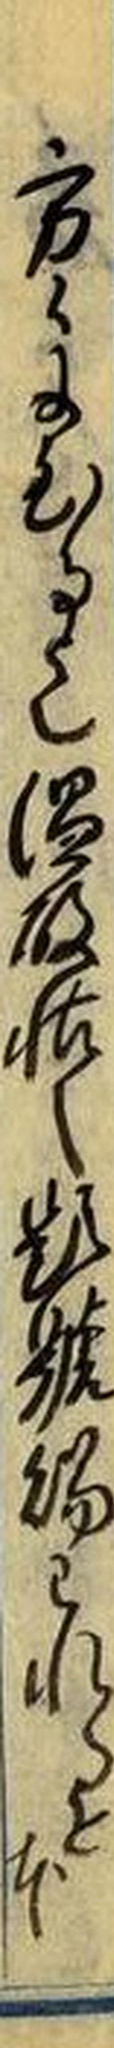方々に至る迄温故帖之題号賜われるを本
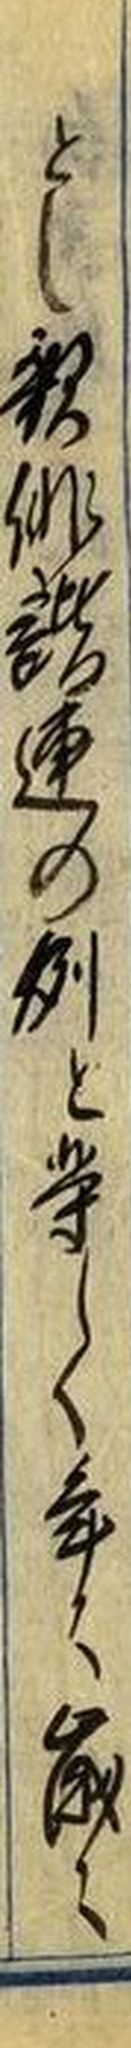とし親俳諧連の例と等しく年々歳々
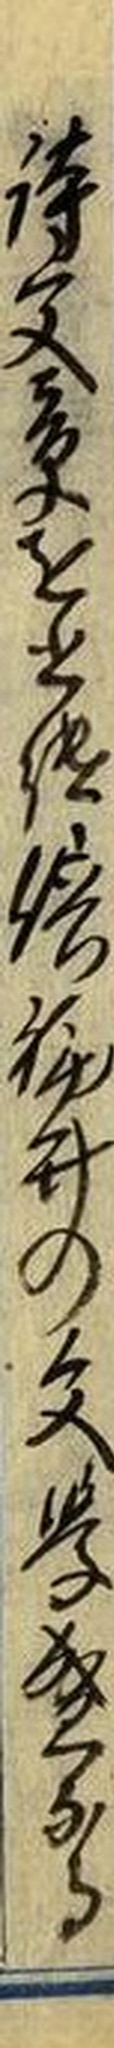使詩文章を書継倍福井の文学盛なる
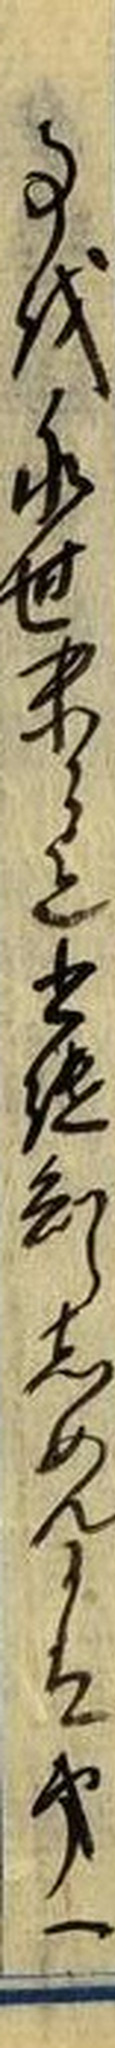事を永世末々迄書継知らしめんにて第一
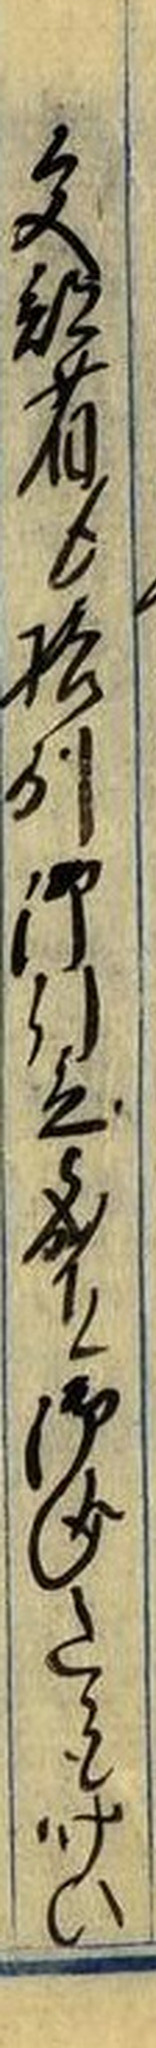文部省も格別御引立被成下候御趣意にも叶ひ
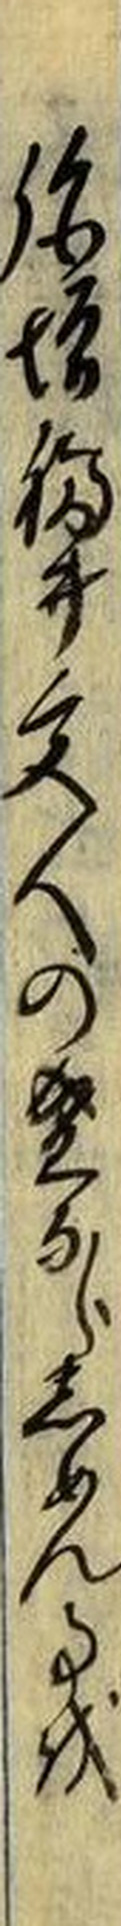弥増福井文人の盛ならしめん事を
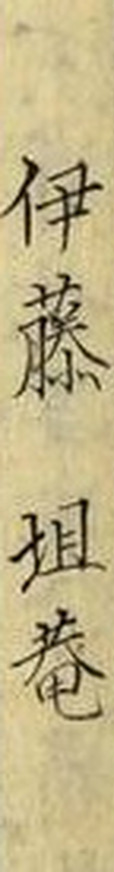伊藤坦庵

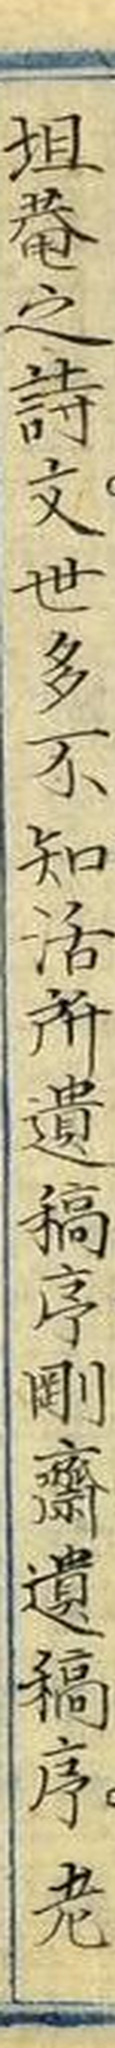坦庵之詩文。世多不知。活所遺稿序。剛斎遺稿序。老
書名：温古集 四巻
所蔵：福井県文書館 Fukui Prefectural Archives
